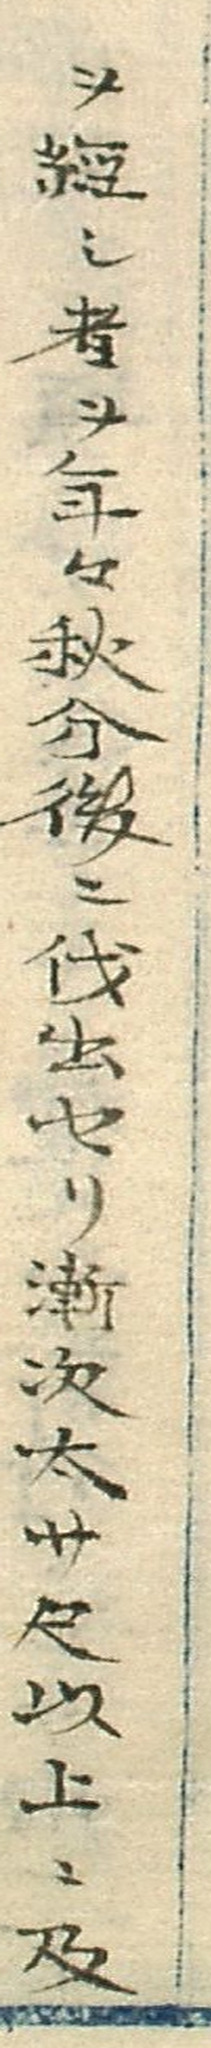ヲ経シ者ヲ年々秋分後ニ伐出セリ漸次太サ尺以上ニ及
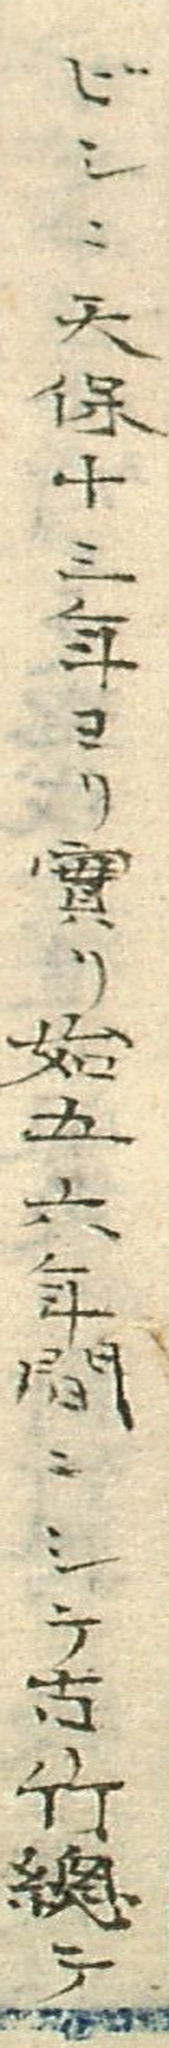ビシニ天保十三年ヨリ実リ始五六年間ニシテ古竹総テ
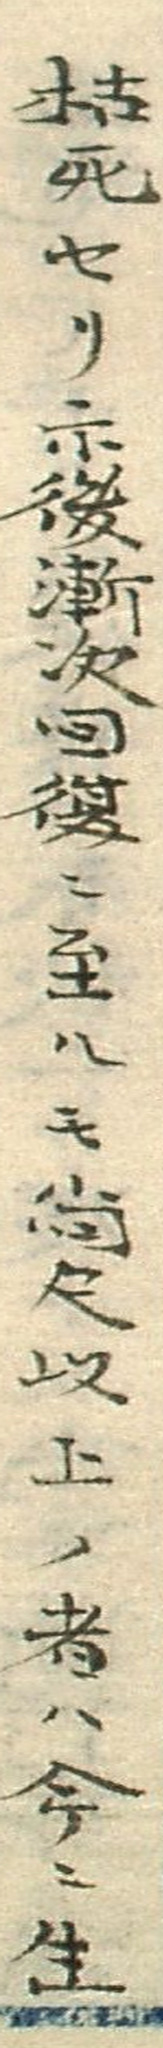枯死セリ示後漸次回復ニ至ルモ尚尺以上ノ者ハ今ニ生
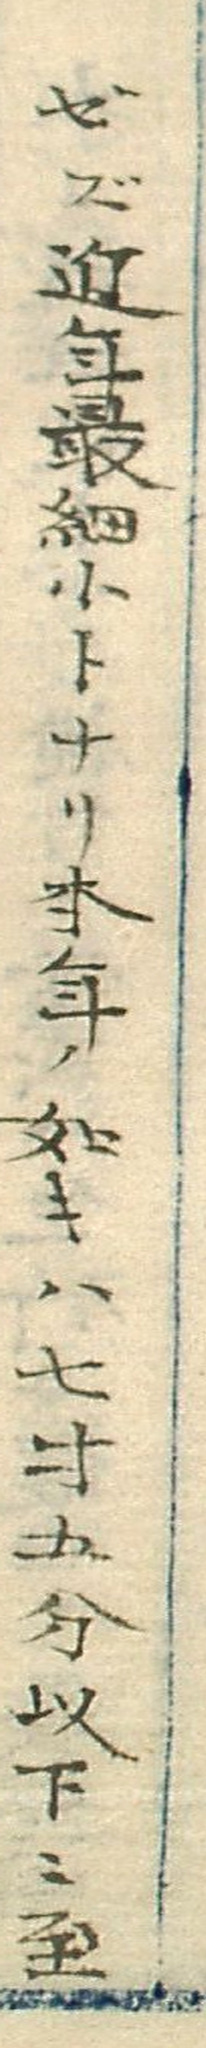ゼズ近年最細小トナリ本年ノ如キハ七寸五分以下ニ至
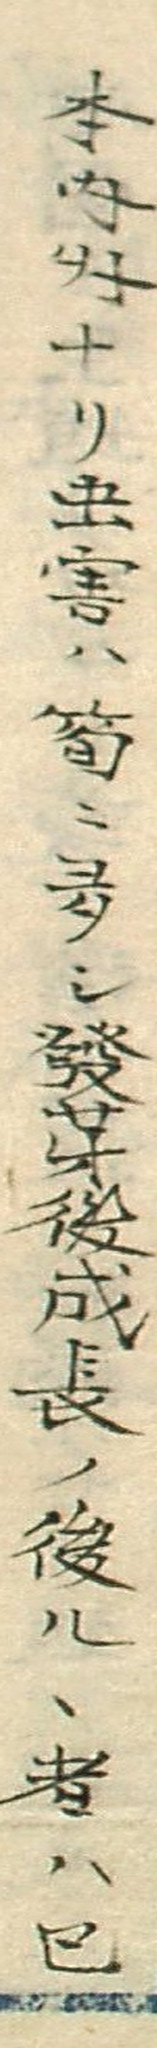本内外ナリ虫害ハ筍ニ多シ発芽後成長ノ後ルヽ者ハ已
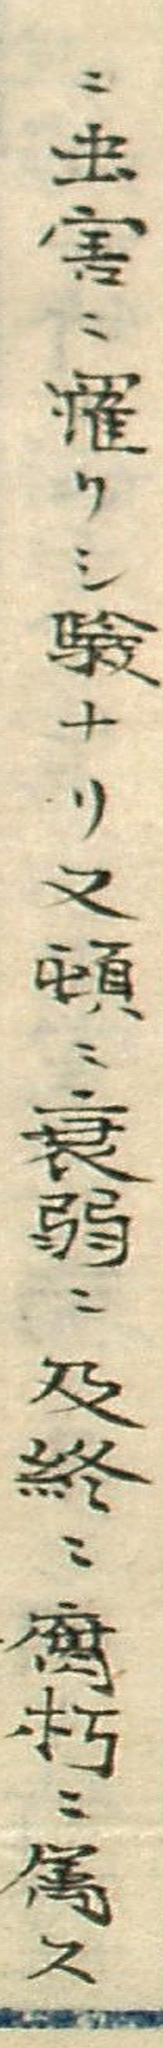ニ虫害ニ罹リシ験ナリ又頓ニ衰弱ニ及終ニ腐朽ニ属ス

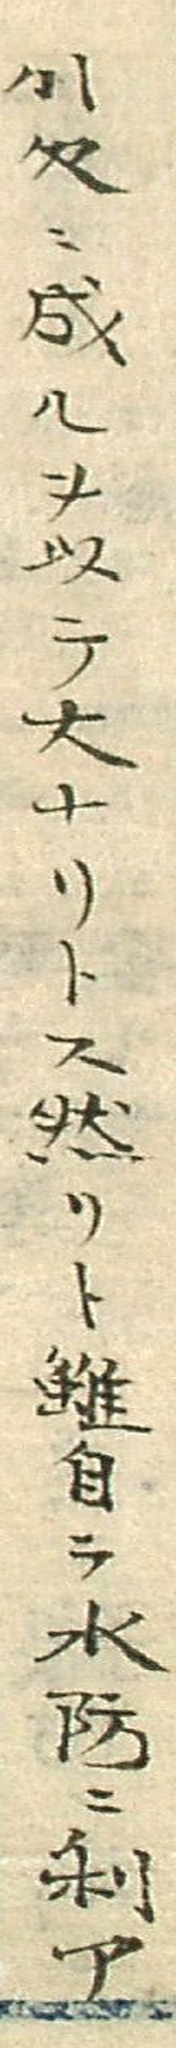川欠ニ成ルヲ以テ大ナリトス然リト雖自ラ水防ニ利ア
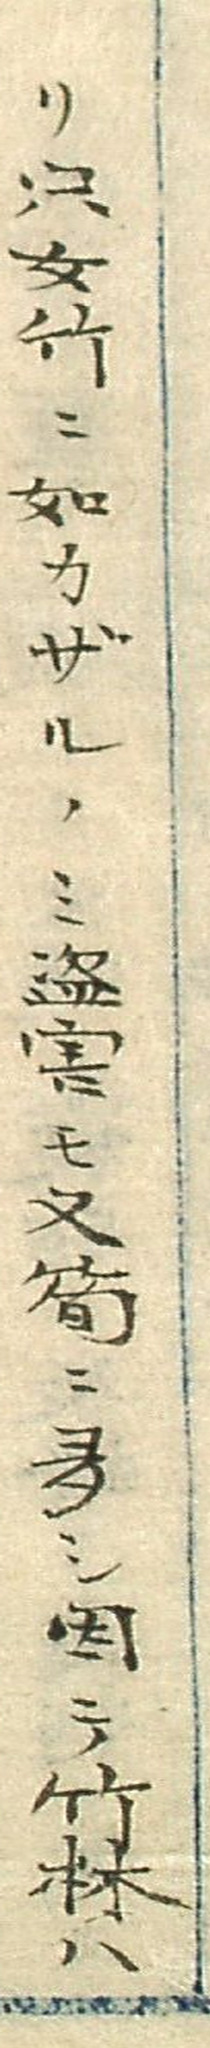リ只女竹ニ如カザルノミ盗害モ又筍ニ多シ因テ竹林ハ
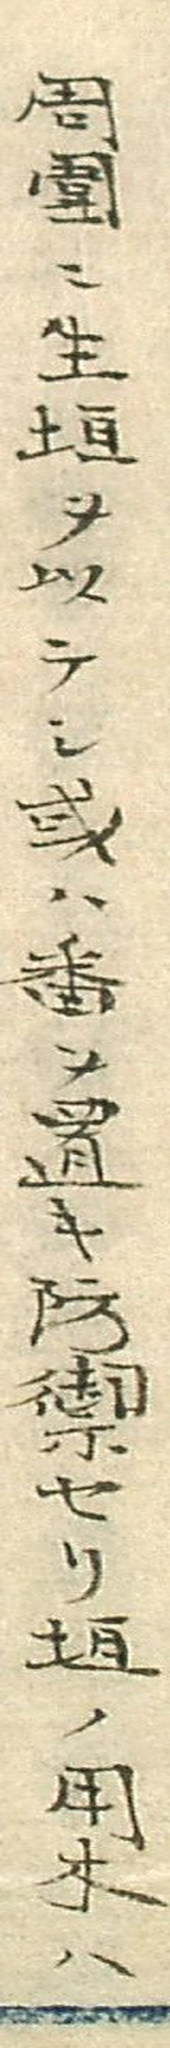周囲ニ生垣ヲ以テシ或ハ番ヲ置キ防禦セリ垣ノ用木ハ
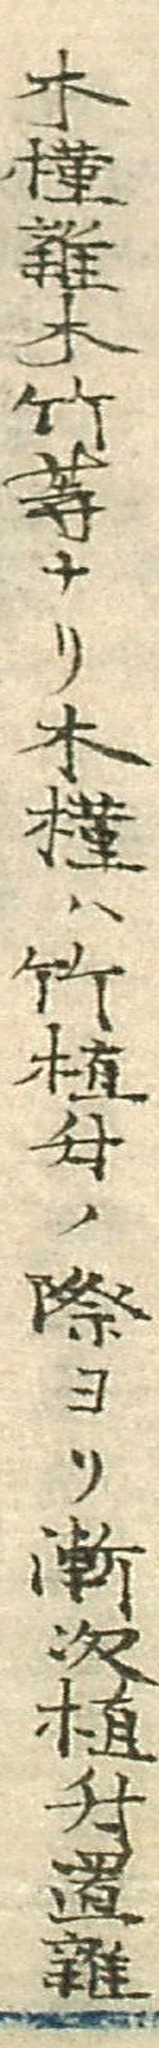木槿雑木竹等ナリ木槿ハ竹植付ノ際ヨリ漸次植付置雑
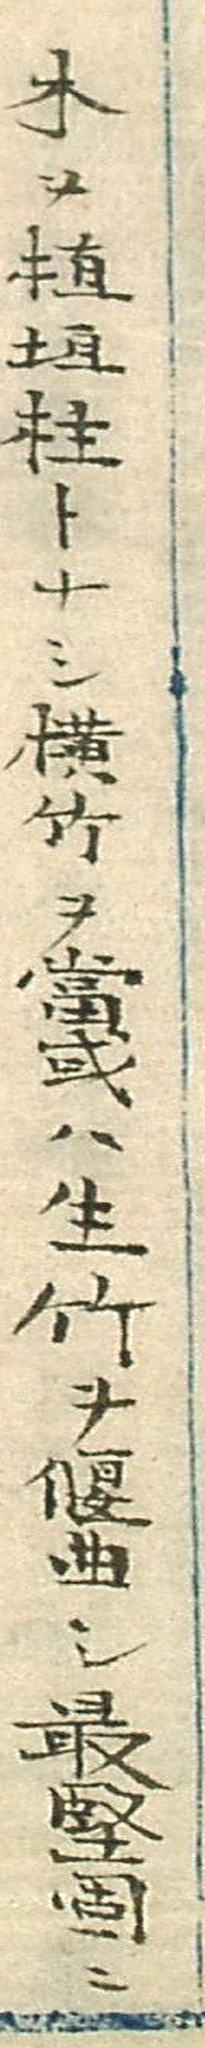木ヲ植垣柱トナシ横竹ヲ当或ハ生竹ヲ偃曲シ最堅固ニ
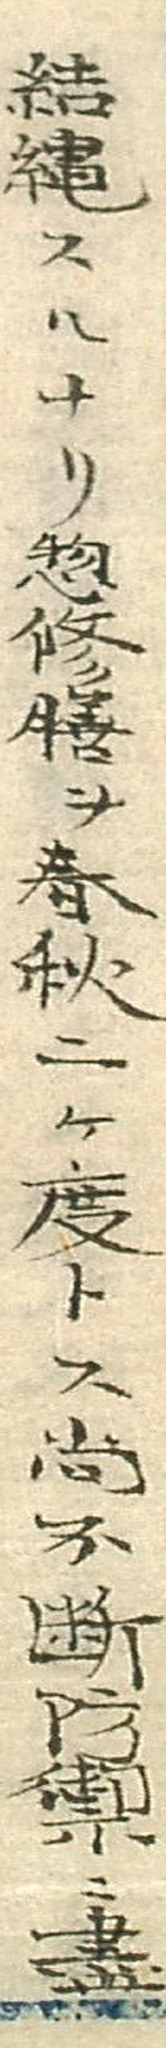結縄スルナリ惣修膳ヲ春秋二ヶ度トス尚不断防禦ニ尽
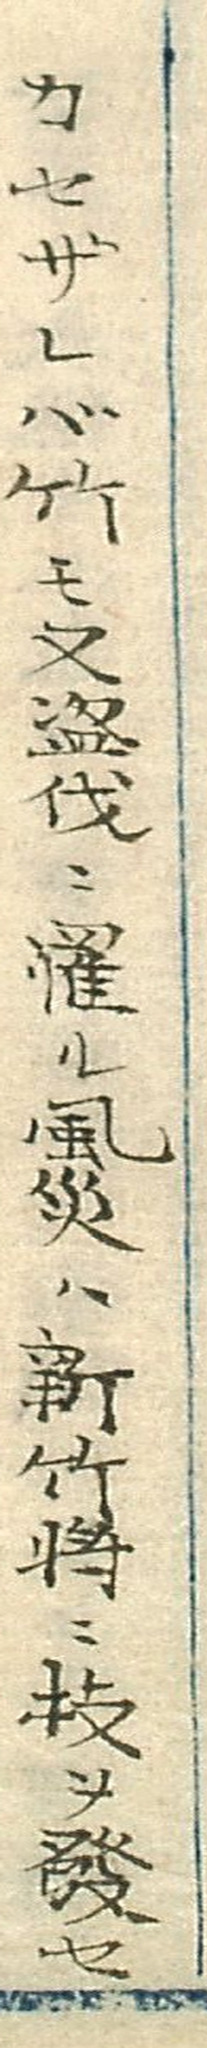力セザレバ竹モ又盗伐ニ罹ル風災ハ新竹将ニ枝ヲ発セ
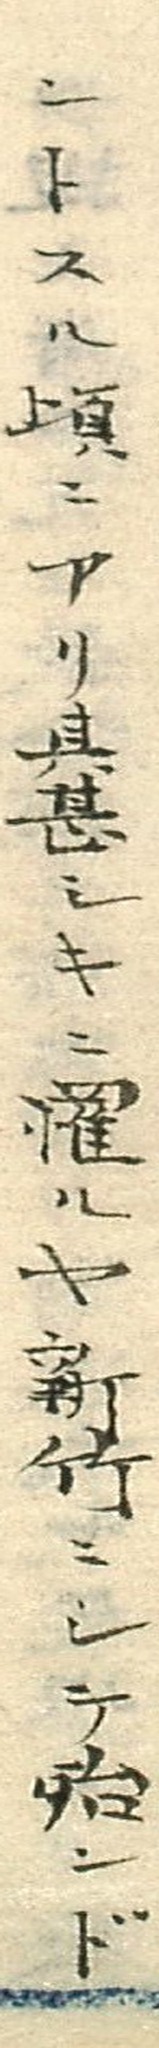ントスル頃ニアリ其甚シキニ罹ルヤ新竹ニシテ殆ンド
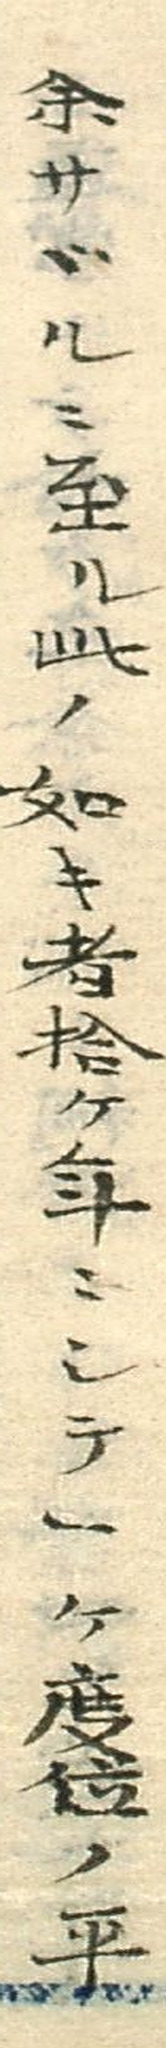余サヾルニ至ル此ノ如キ者拾ヶ年ニシテ一ヶ度位ノ平
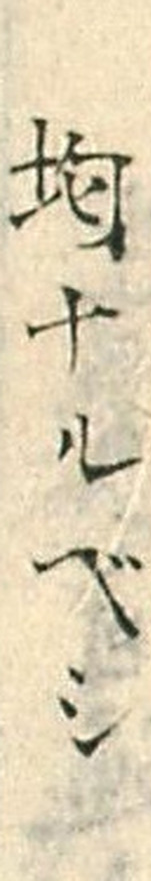均ナルベシ
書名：山林共進会取調書
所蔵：鳴門教育大学 Naruto University of Education
